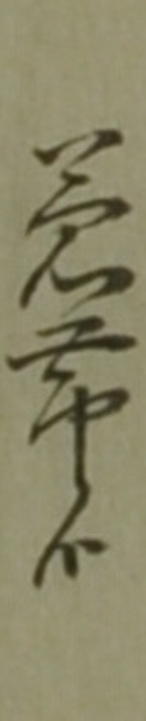兼帯ゟ
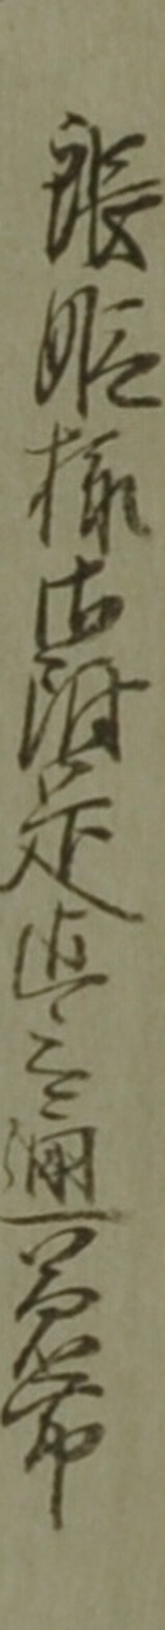鋹姫様御附是迄之通兼帯
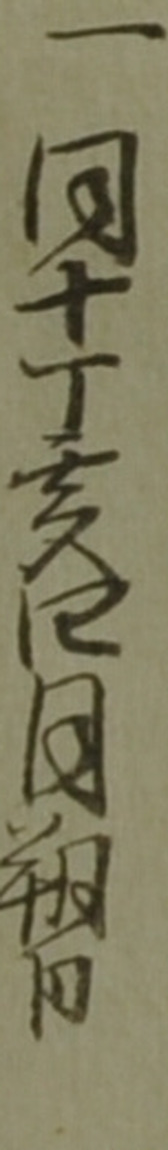一同十丁亥四月朔日
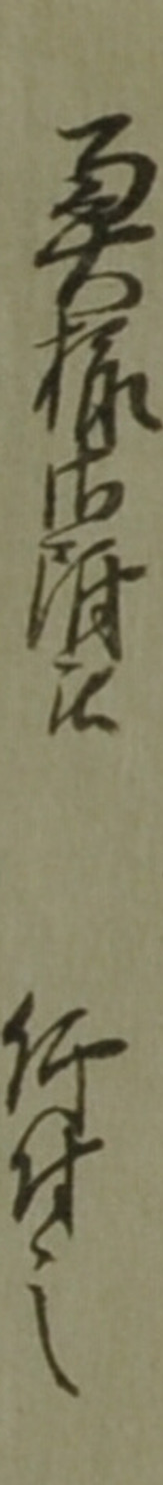奥様御附被仰付之
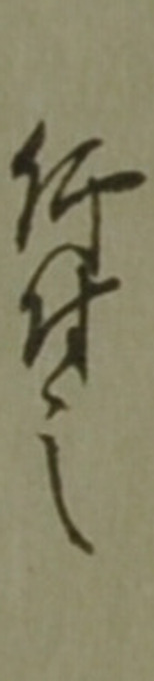仰付之
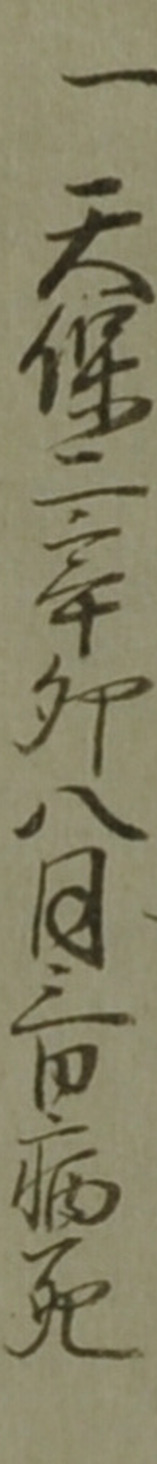一天保二辛卯八月三日病死
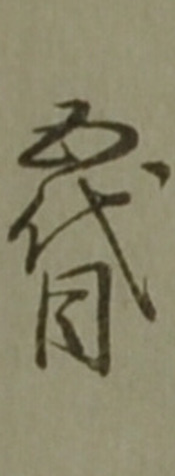五代目
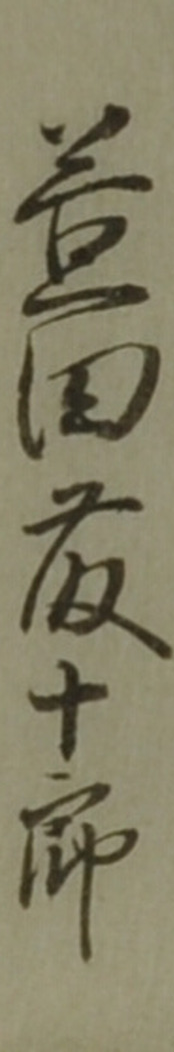益田藤十郎
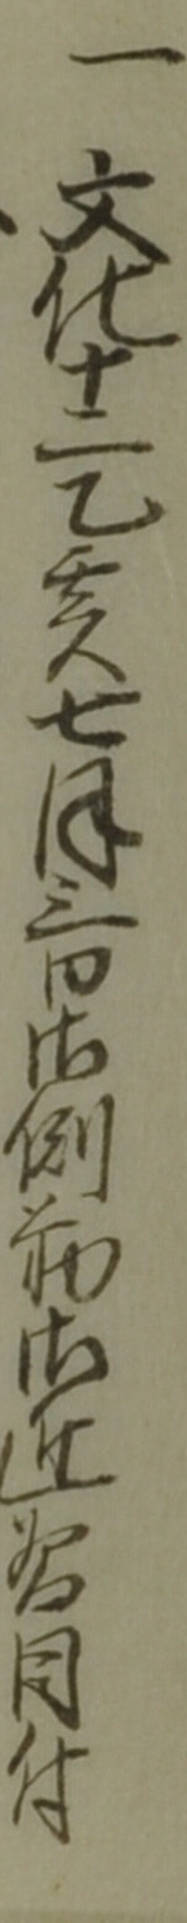一文化十二乙亥七月三日御側勤御近習目付
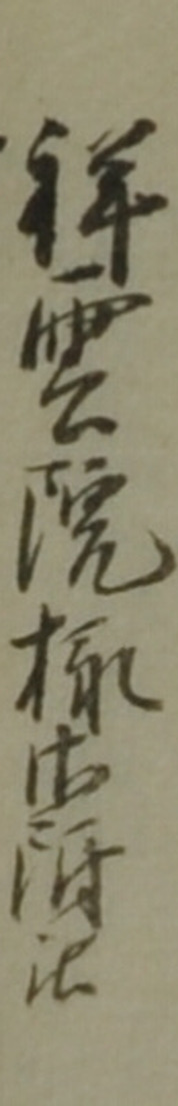祥雲院様御附被
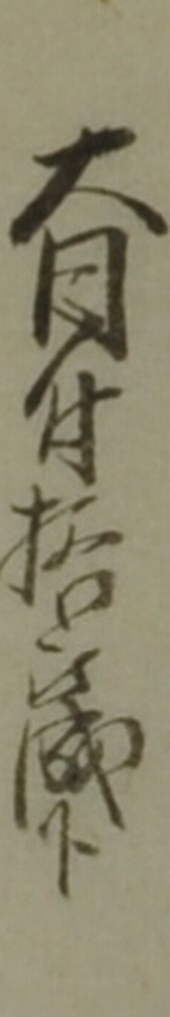大目付格被成下
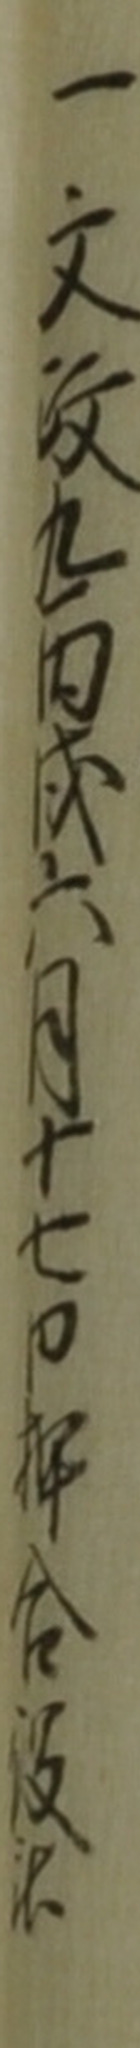一文政九丙戌六月十七日押合役被
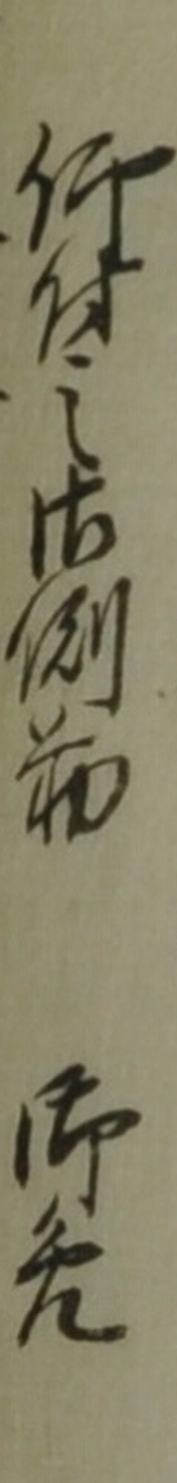仰付之御側勤御免
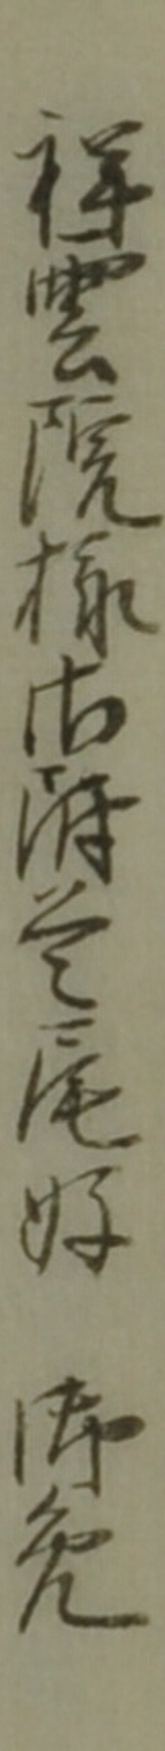祥雲院様御附首尾好御免
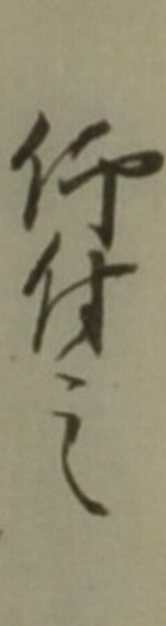仰付之
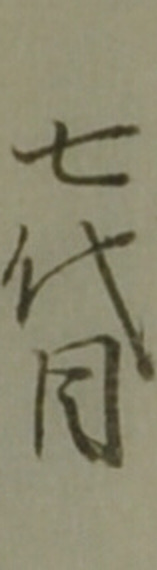七代目
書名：諸御役代々録（六）
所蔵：伊那市立高遠町図書館・合同会社AMANE
